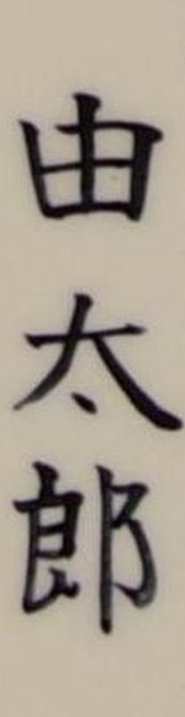由太郎
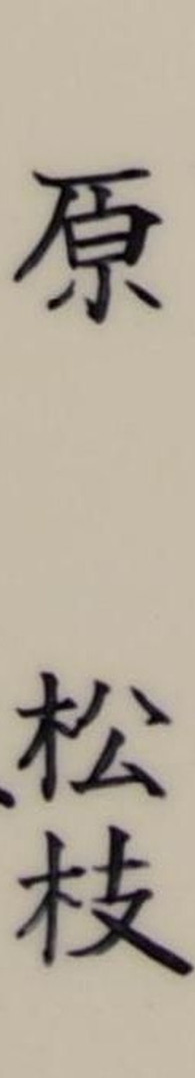原松枝
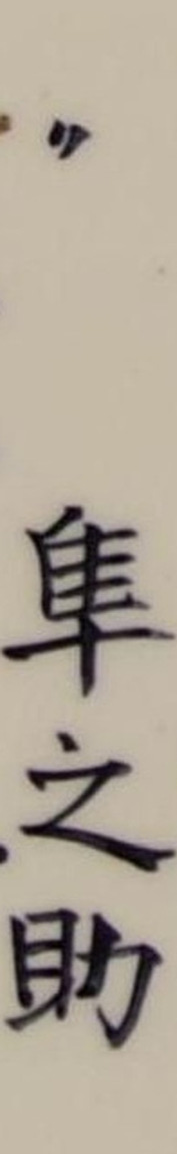隼之助
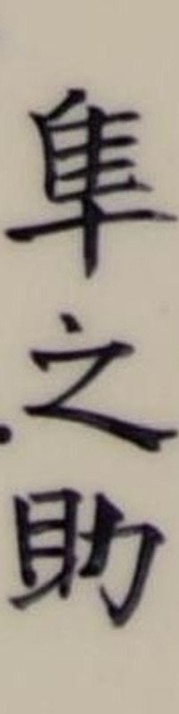隼之助
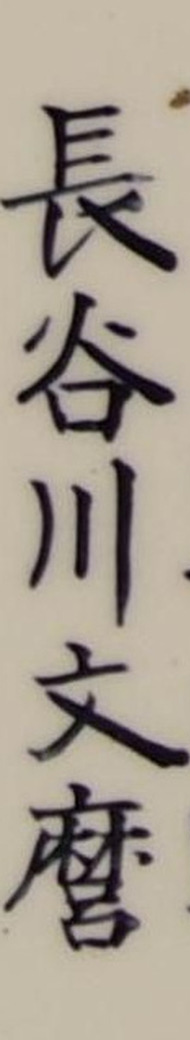長谷川文麿
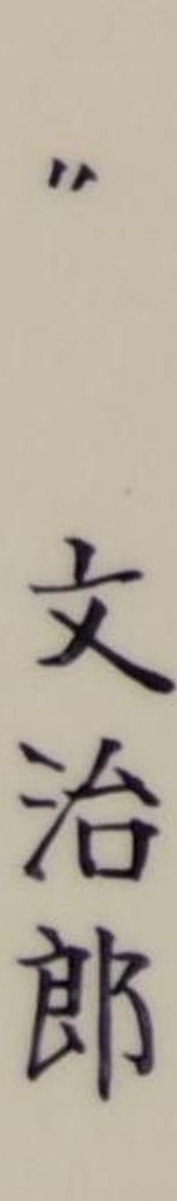文治郎
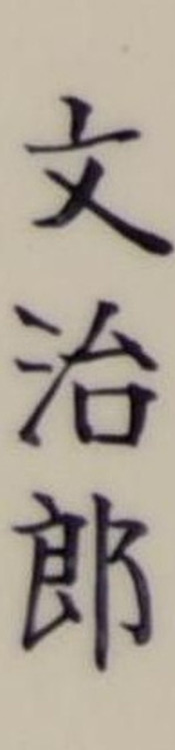文治郎
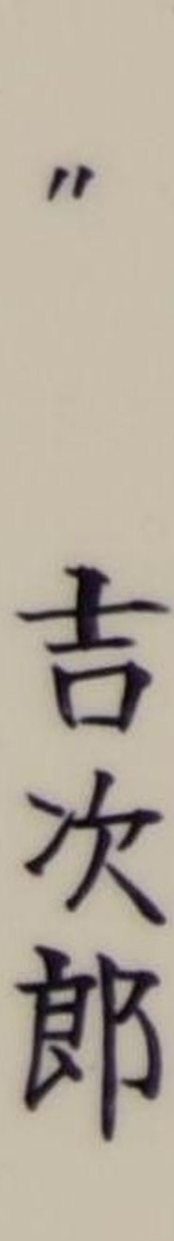吉次郎
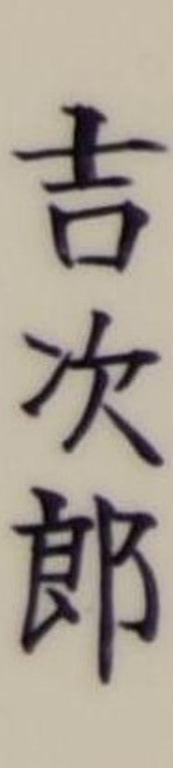吉次郎
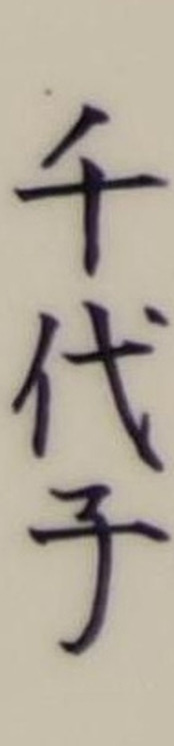千代子

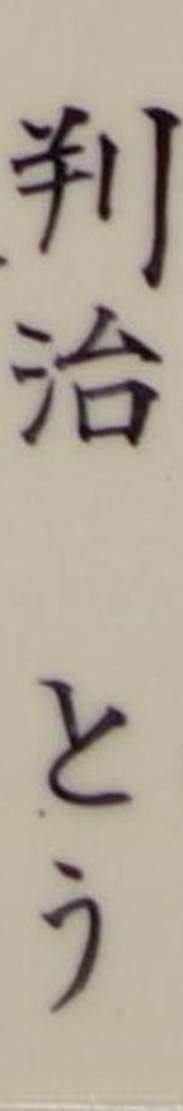判治とう
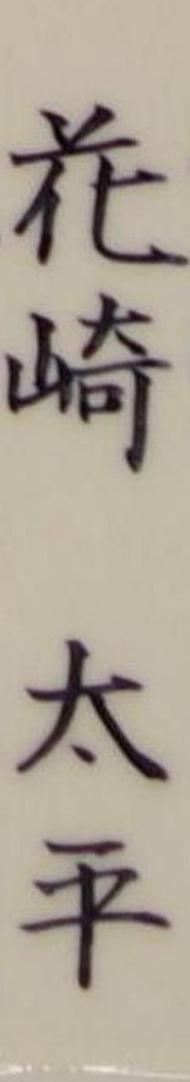花崎太平
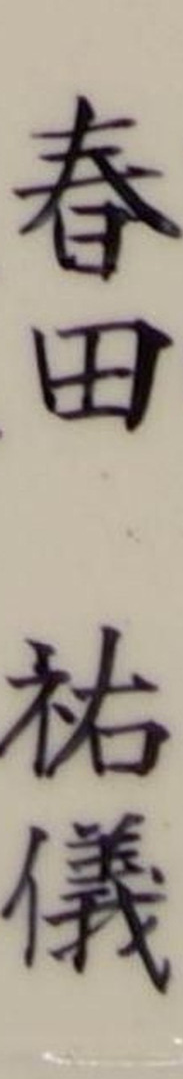春田祐儀
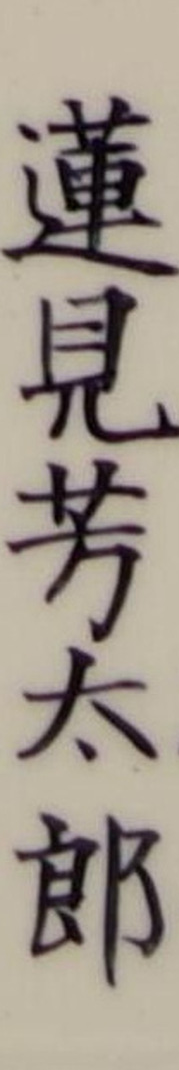蓮見芳太郎
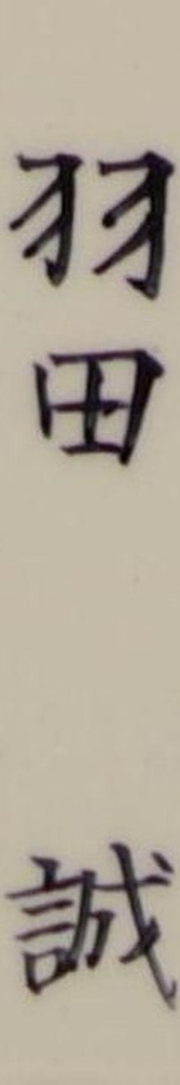羽田誠
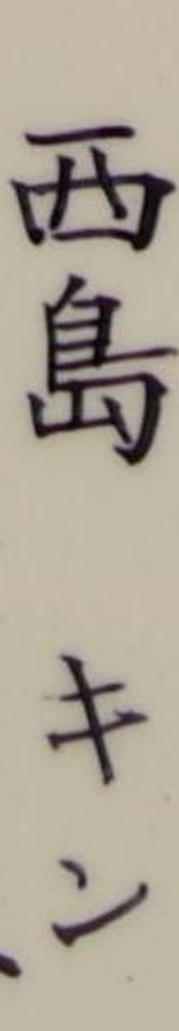西島キン
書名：M~S
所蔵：高野山金剛峯寺
